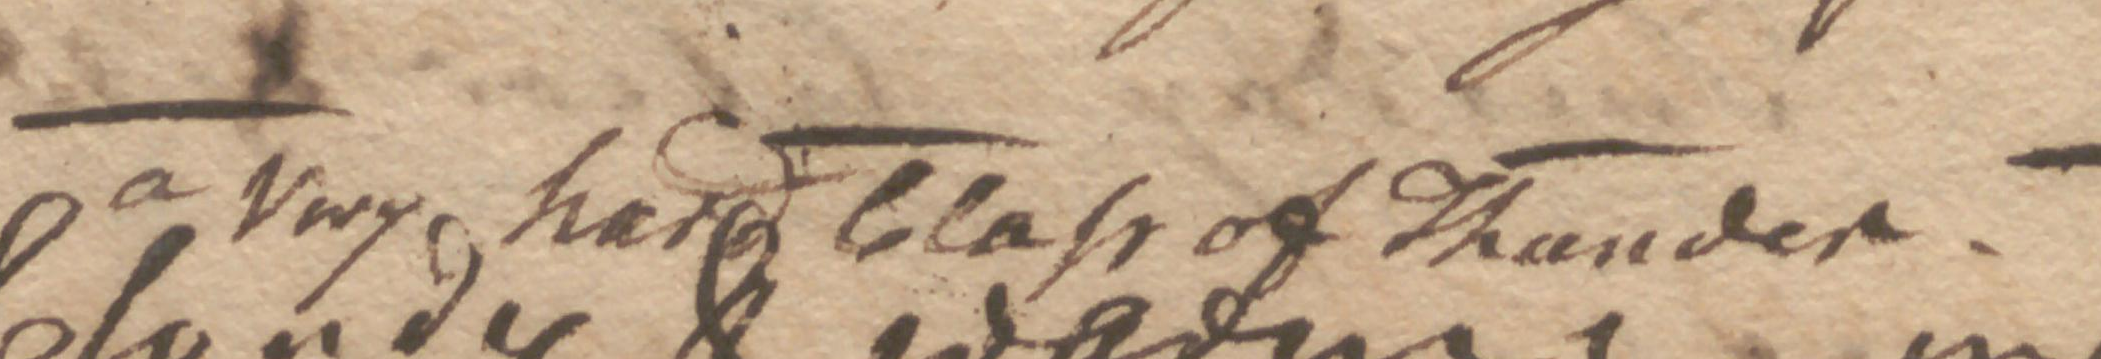a Very hard Clap of Thunder.
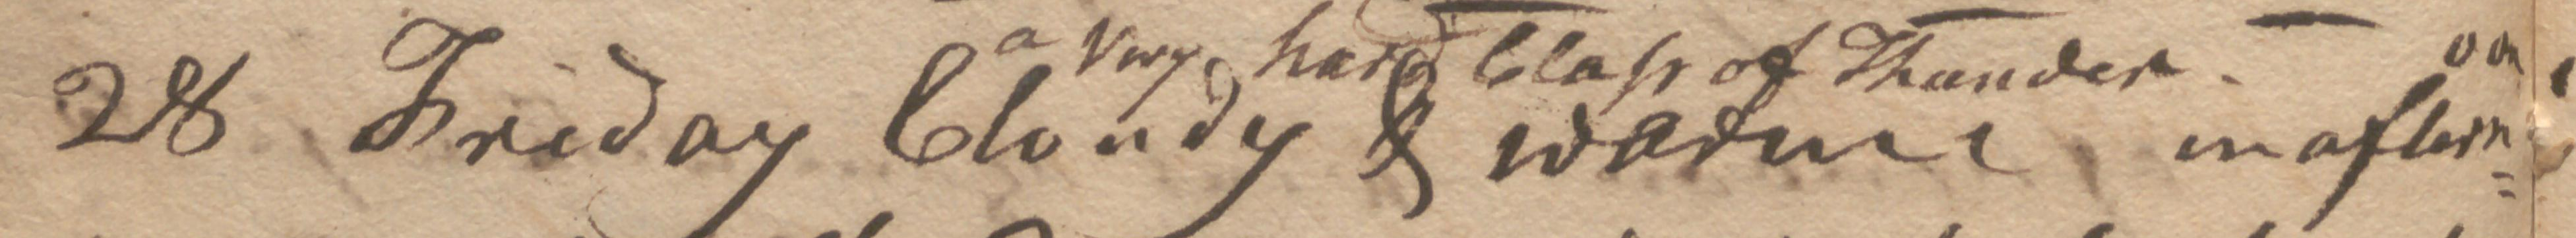28 Friday Cloudy & warm ^ in aftern^oon
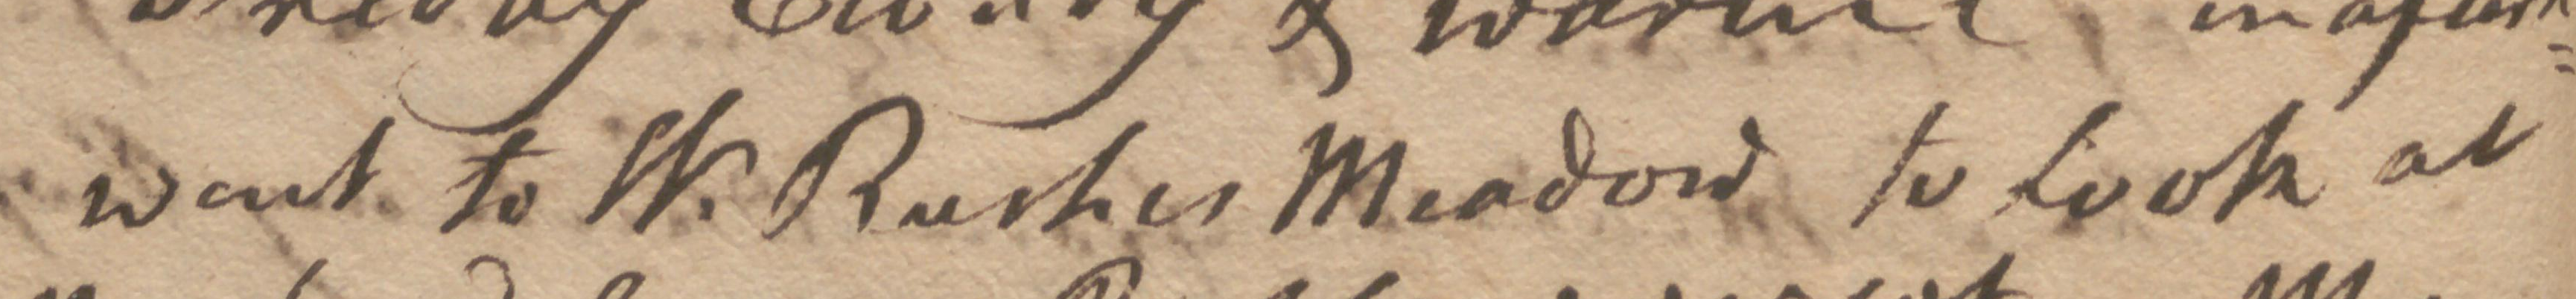went to W. Rushes Meadow to look at
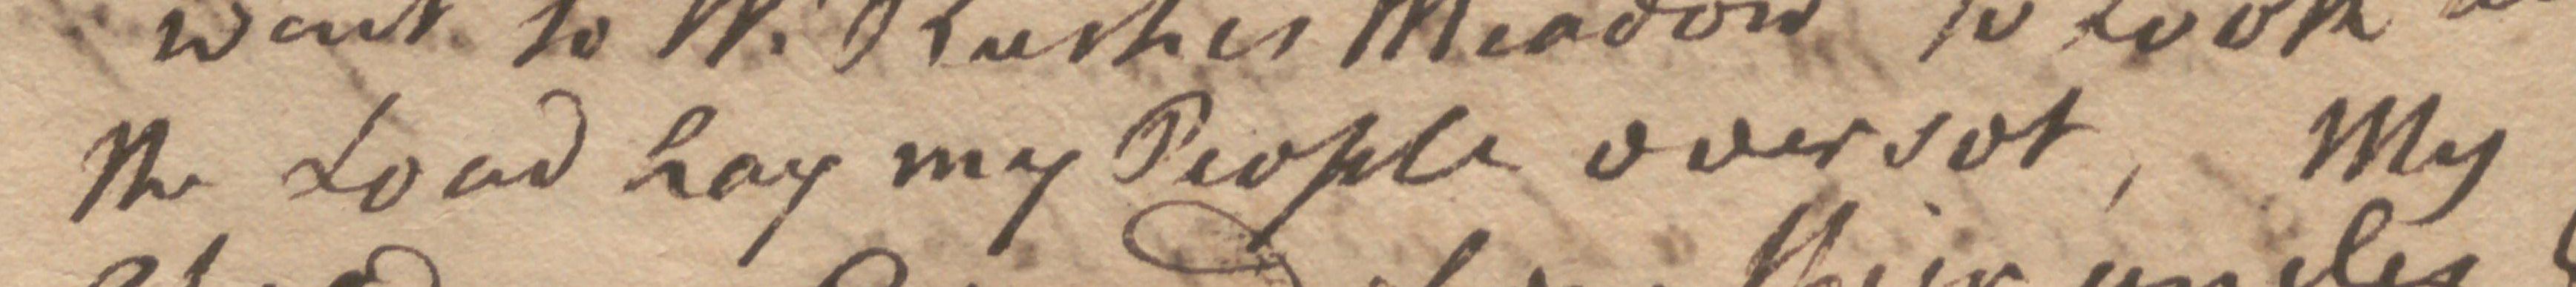the Load hay my People over sot, My
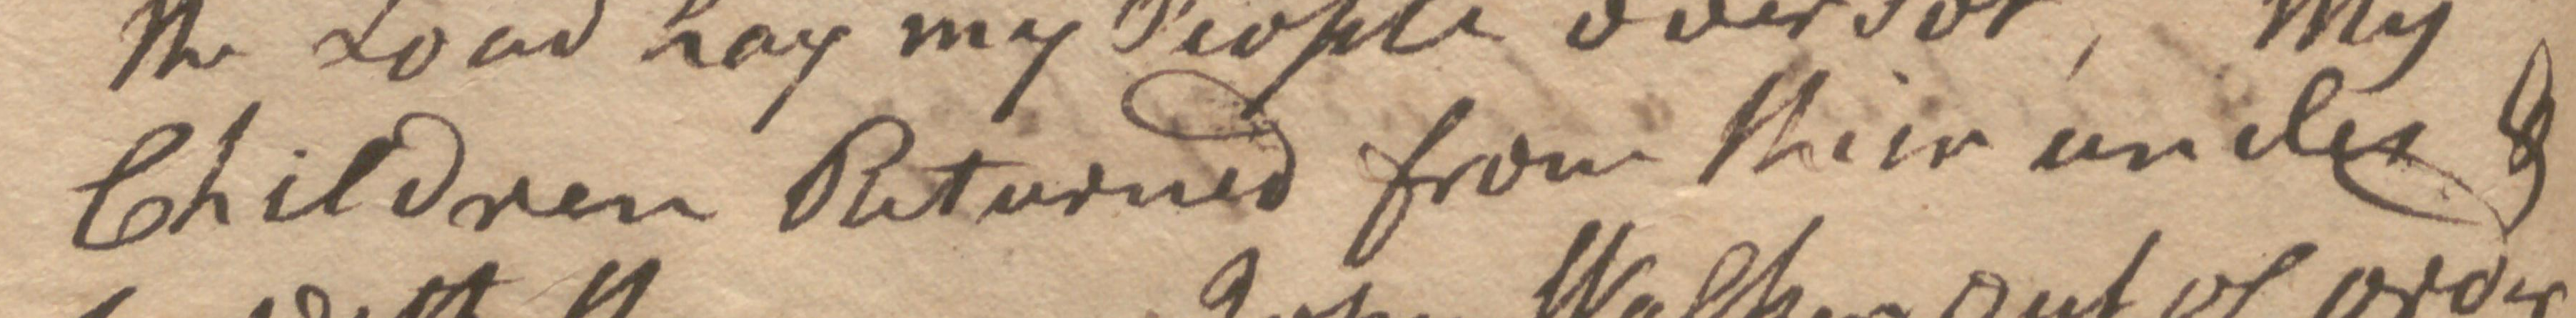Children Returned from their uncles &
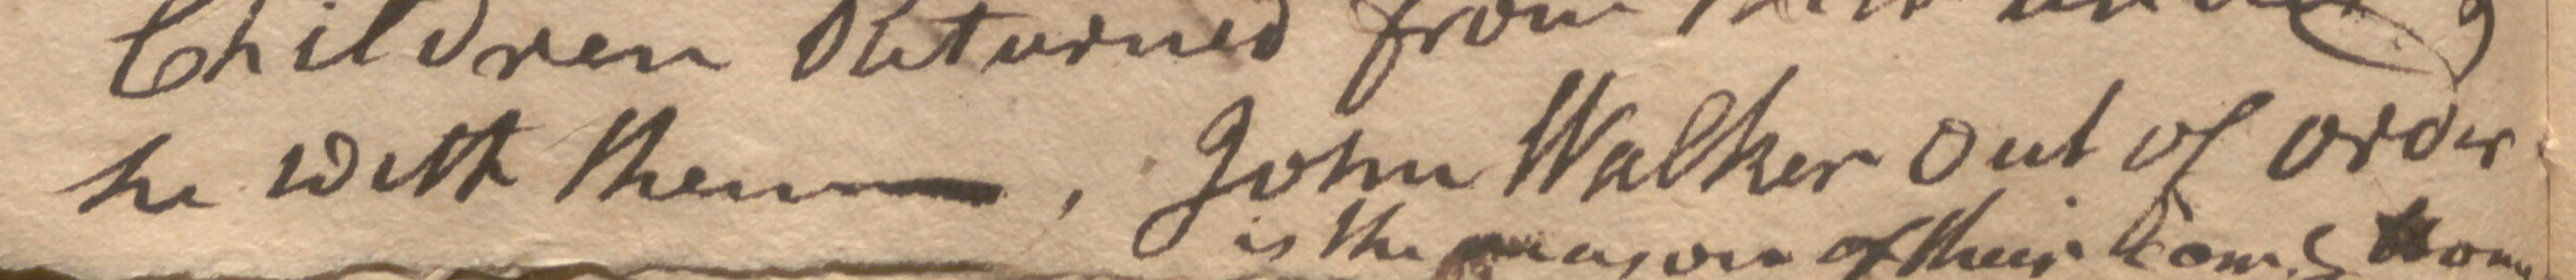he with them, John Walker out of order
